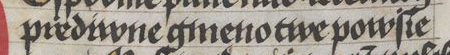pṙediwne gmeno twe powẛie
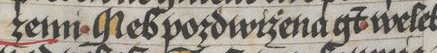zemi.Neb pozdwiżena ḡt weleb¬
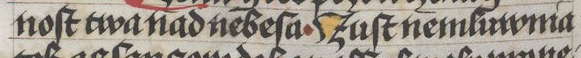noſt twa nad nebeſa.Zuſt nemluwnia¬
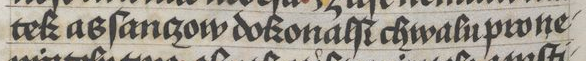tek a sſanczow dokonalſi chwalu pro ne¬
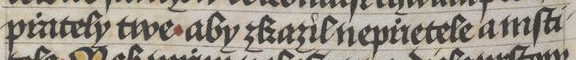pṙately twe.aby zkazil nepṙietele a mſti¬
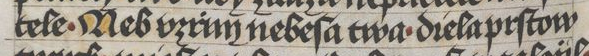tele.Neb uzṙim nebeſa twa.diela prſtow
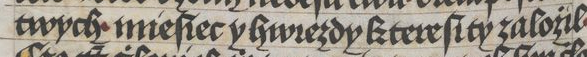twych.mieſiec y hwiezdy ktere ſi ty zalożil.
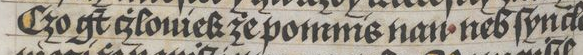Czo ḡt cżloviek že pomnis nan.neb ſyn clo¬
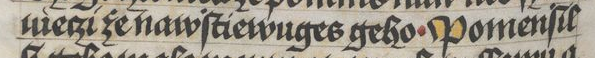vieczí że nawẛtiewuges geho.Pomenẛil
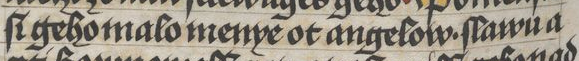ſi geho malo menye ot angelow.ſlawu a
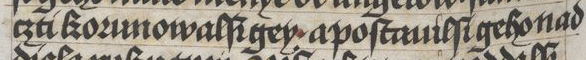cztí korunowalſi gey.a poſtavilſi geho nad¬
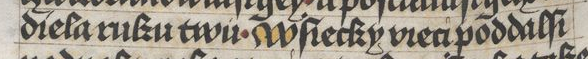diela ruku twu.Wẛíecky vieci poddalſi
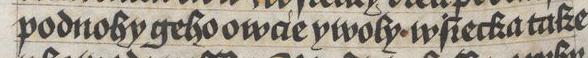podnohy gelo owcie y woly.wẛiecko take
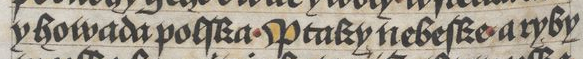y howada polſka.Ptaky nebeſke.a ryby
